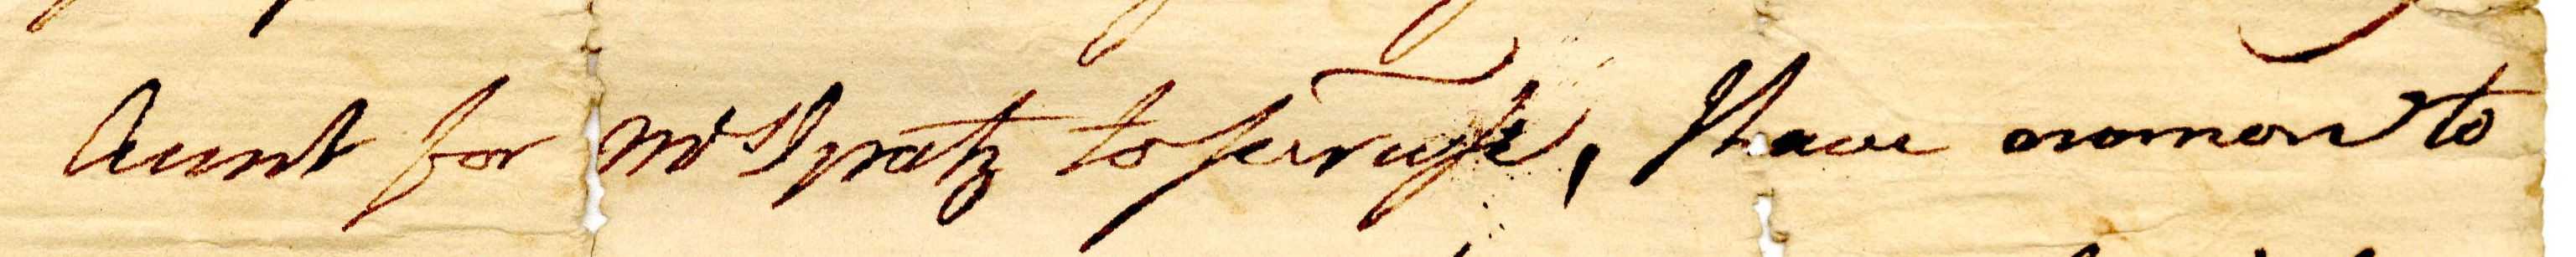Aunt for M^rs Gratz to peruse, I have more to
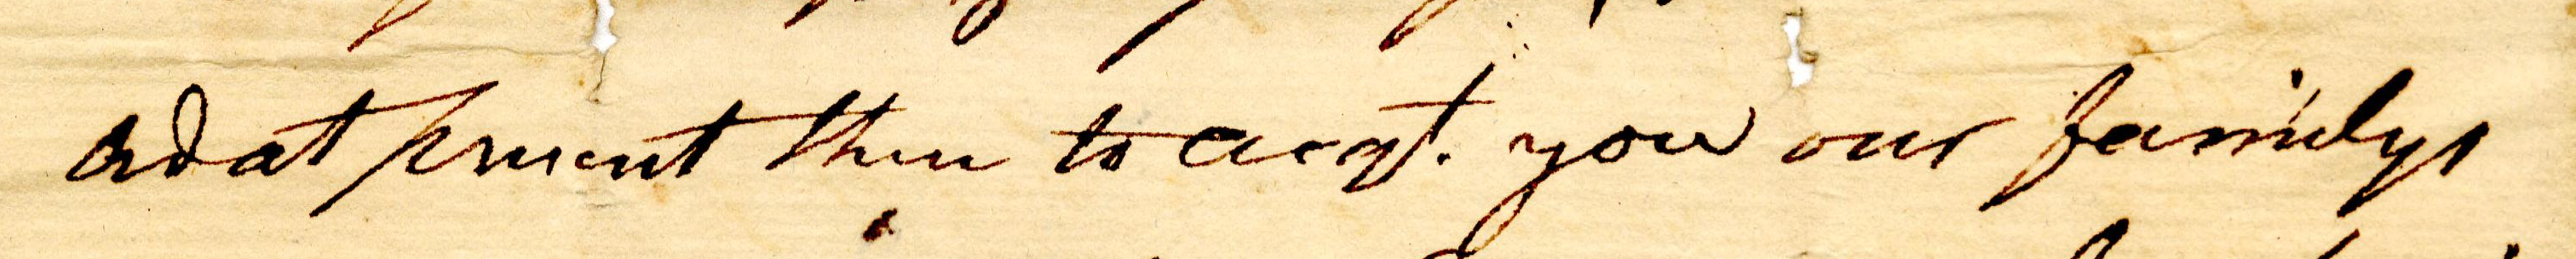ad at present there to acq^t. you our familys
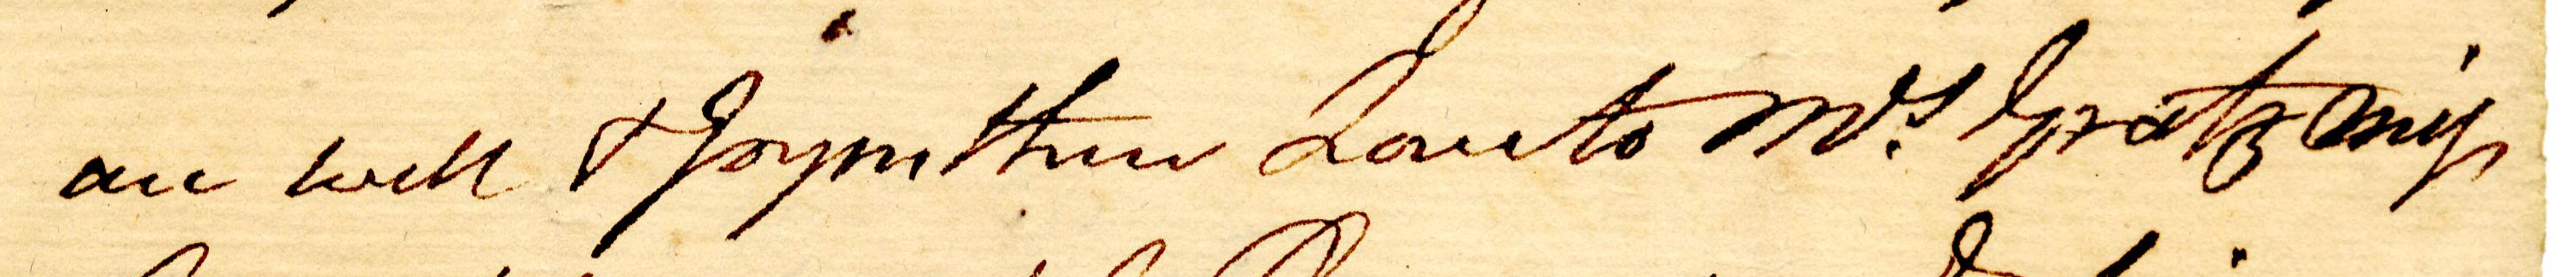are well & Joyn them Loves M^rs Gratz, miss
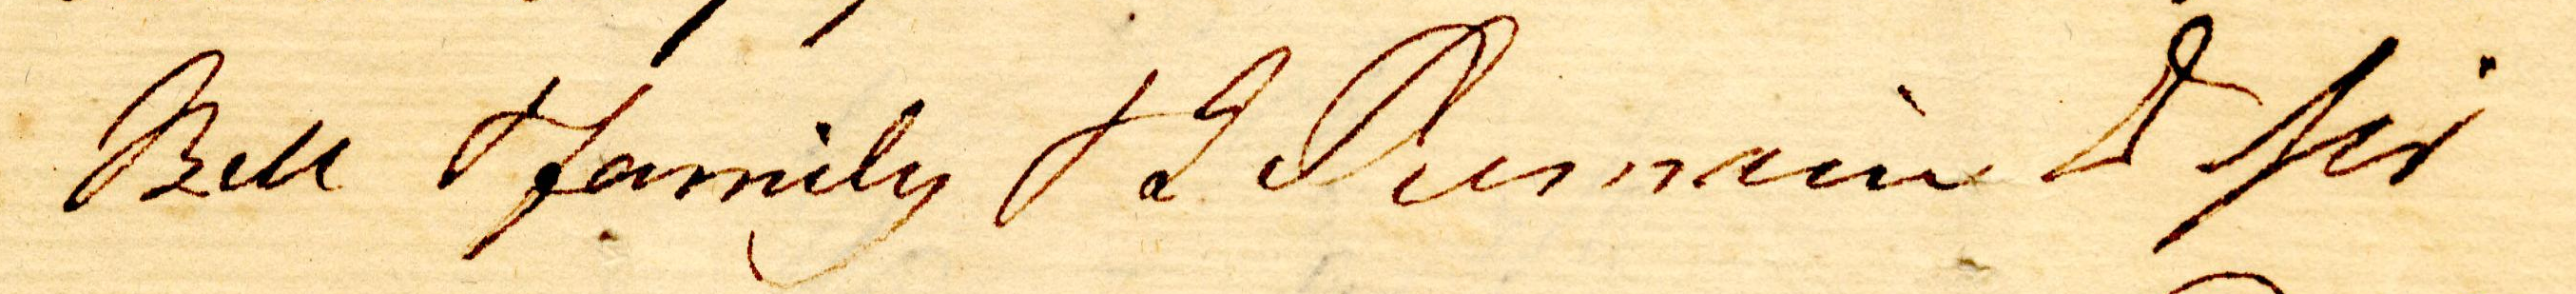Bell & family & I remain D^r sir
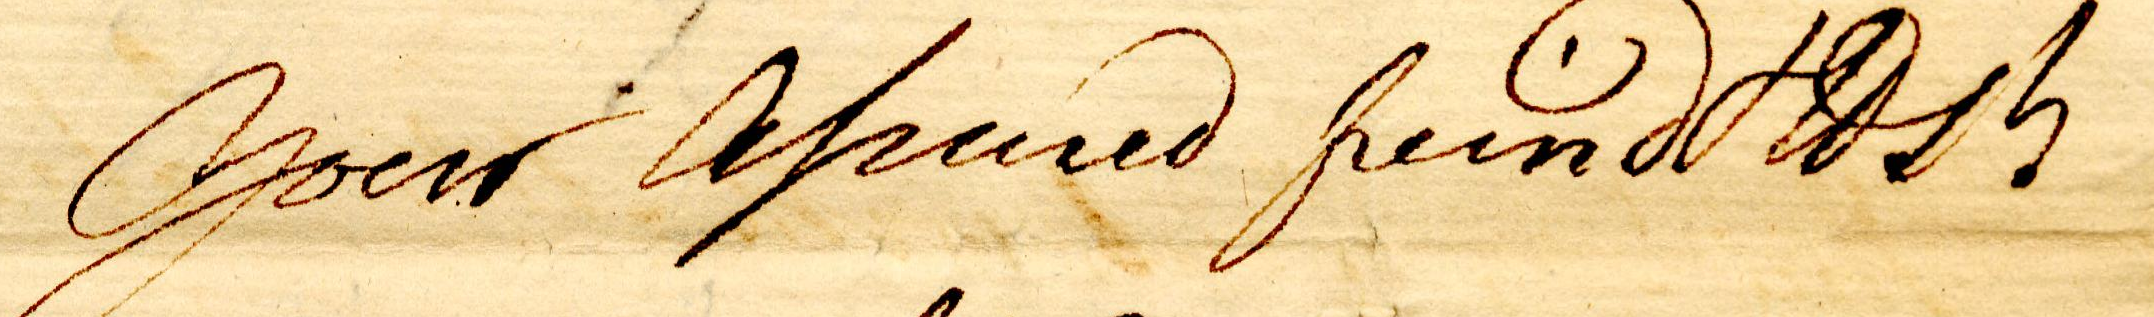Your Assured friend & S^t.
